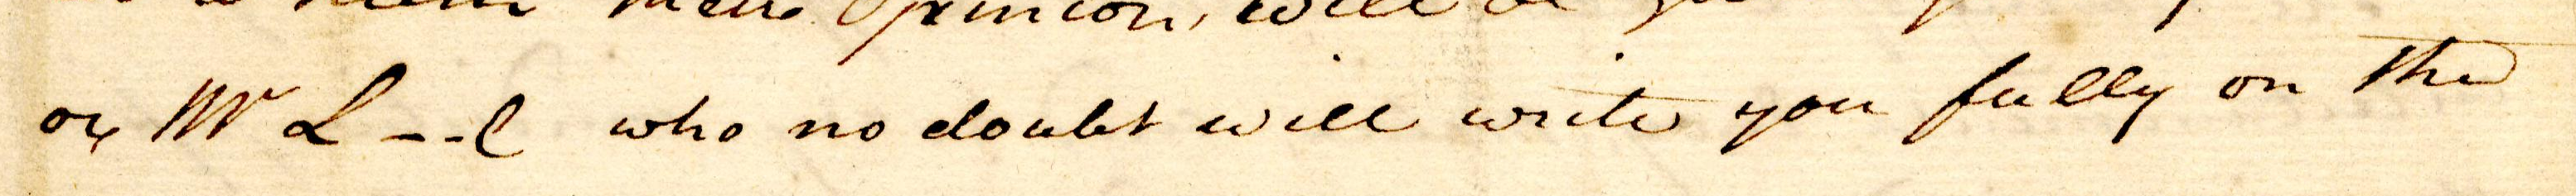or M^r L--l who no doubt will write you fully on the
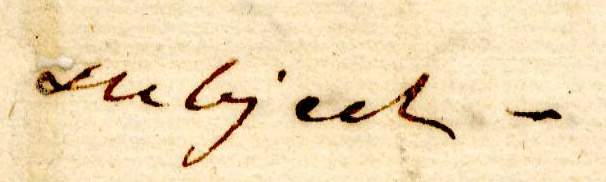subject-
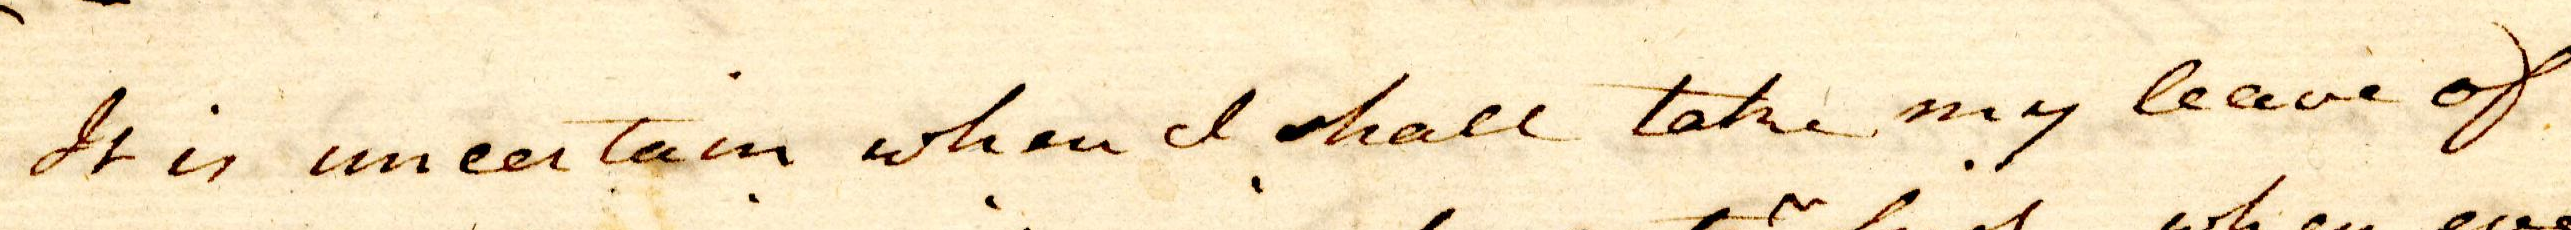It is uncertain when I shall take my leave of
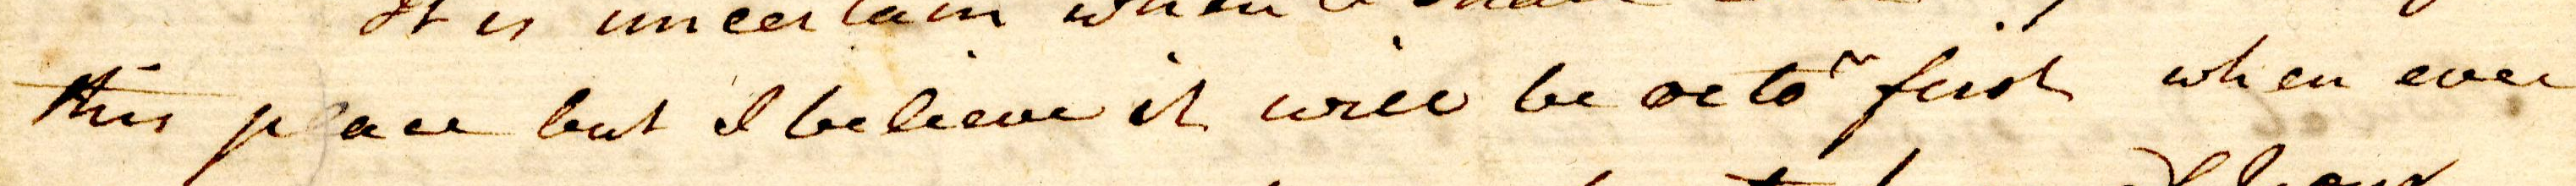this place but I believe it will be oct^r first when ever
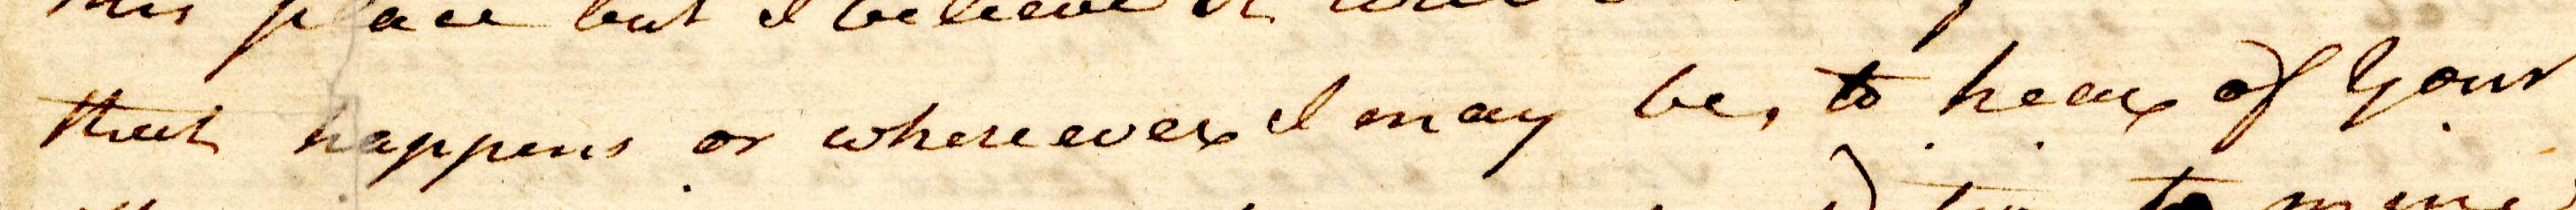that happens or whereever I may be, to hear of your
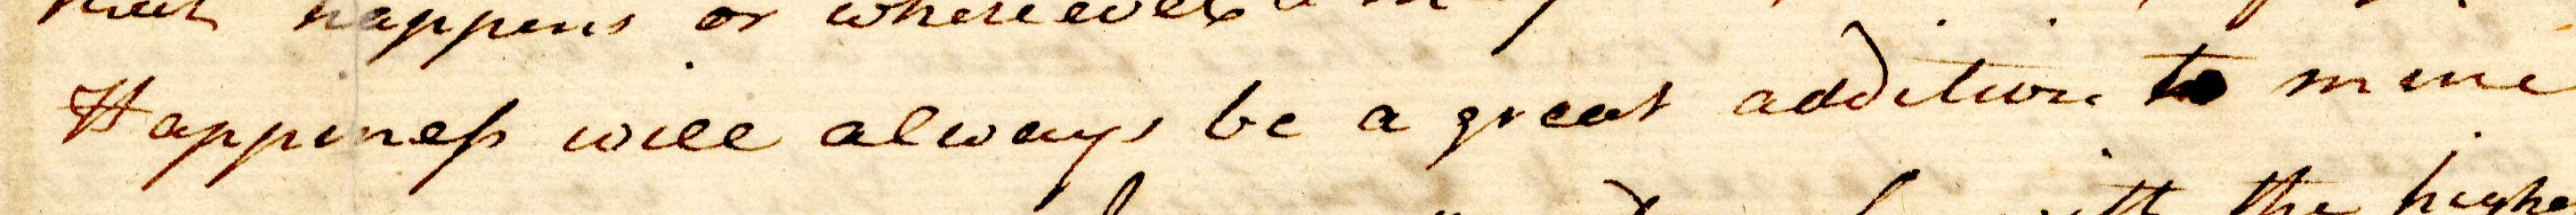Happiness will always be a great addition to mine
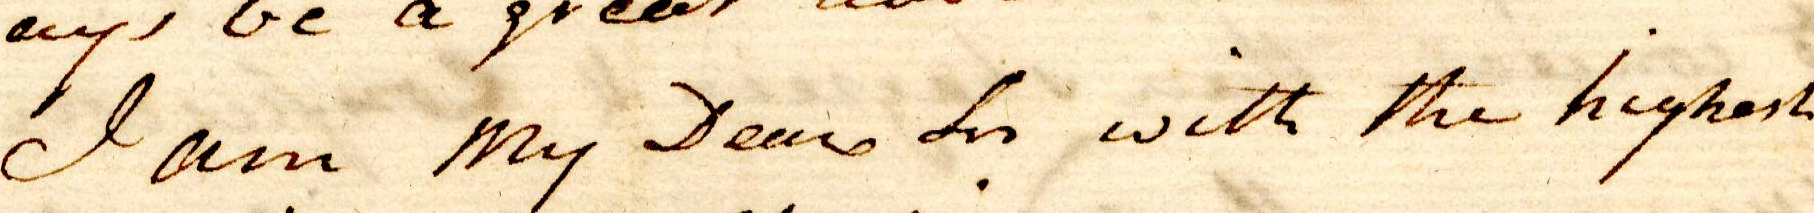& am My Dear sir with the highest
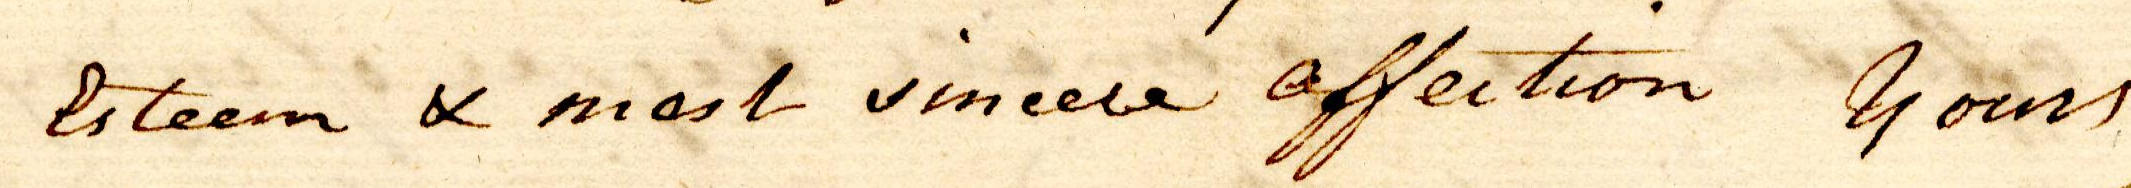Esteem & most sincere affection, Yours
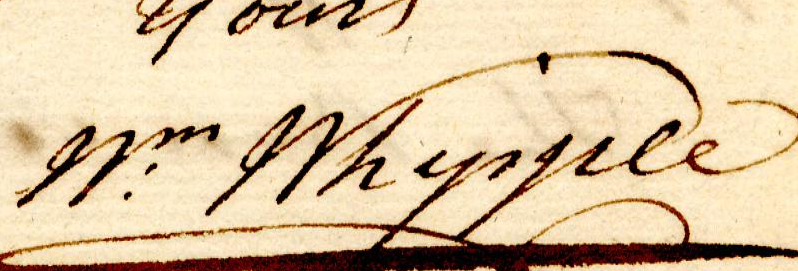W^m: Whipple
